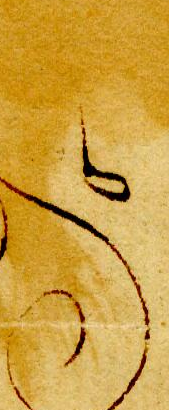To
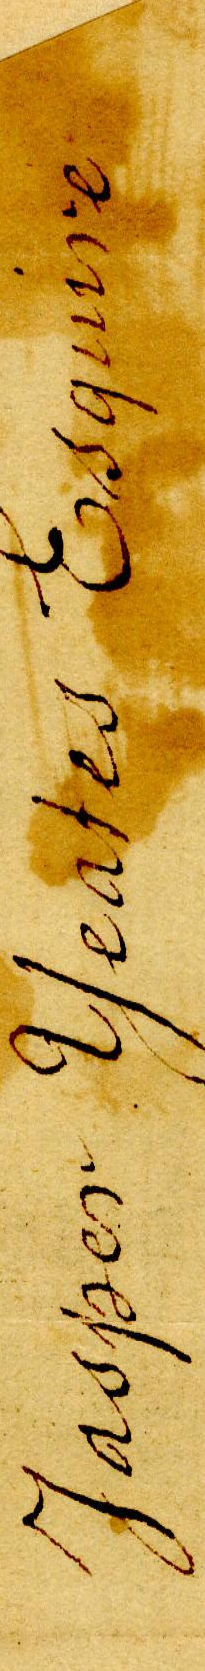Jasper Yeates Esquire
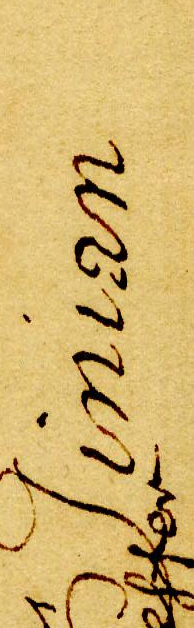Tinian
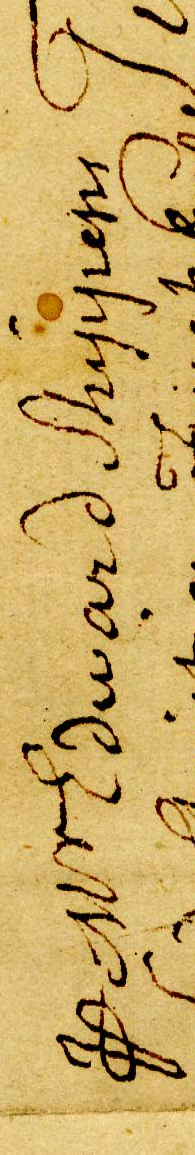per M^r Edward Shippens
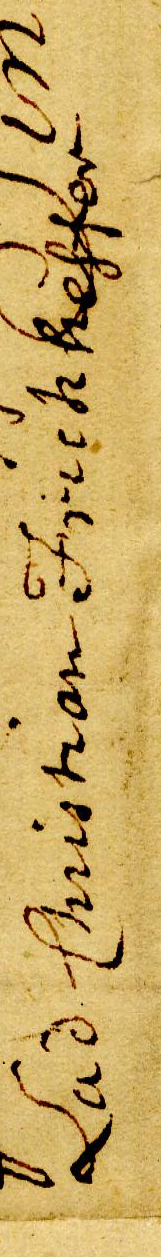Lad Christian Frickheffer
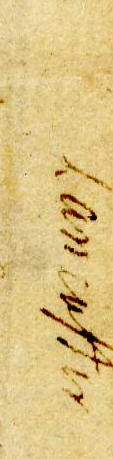Lancaster
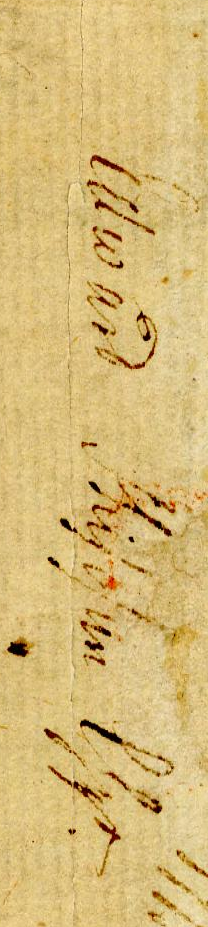Edward Shippen Esq^r.
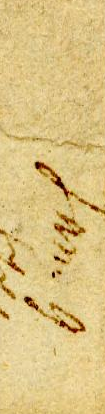Jan. 9
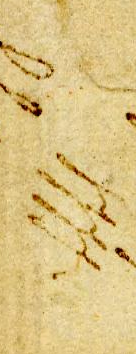1777
